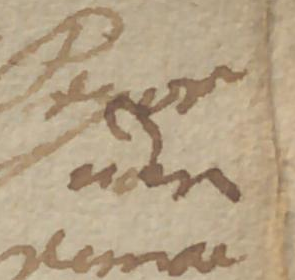nder
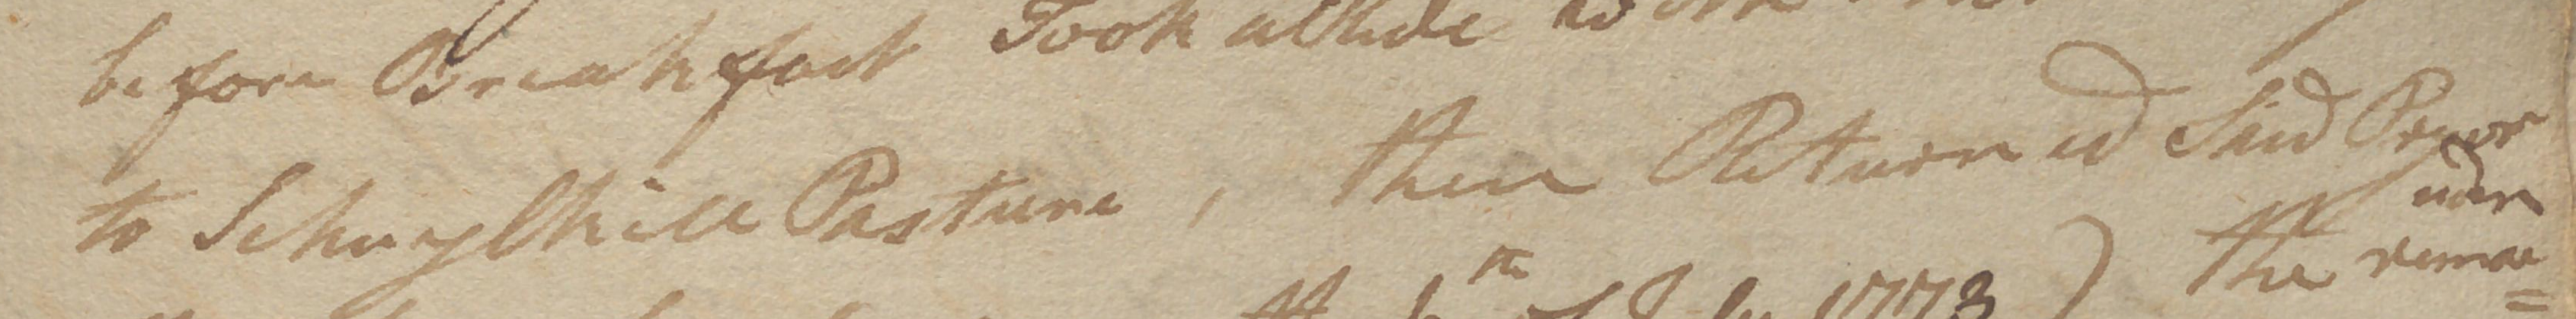to Schuylkill Pasture, then Returned Said Proot
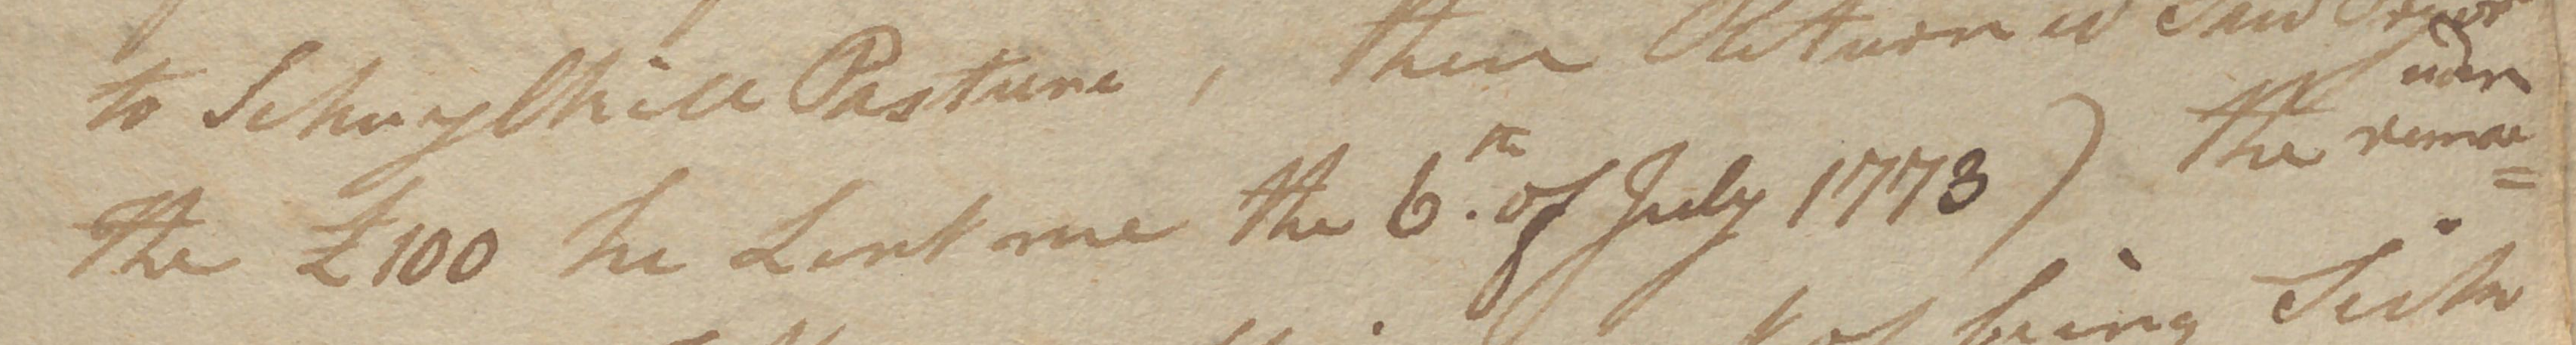The £100 he Lent me the 6^th. of July 1773) the remai-
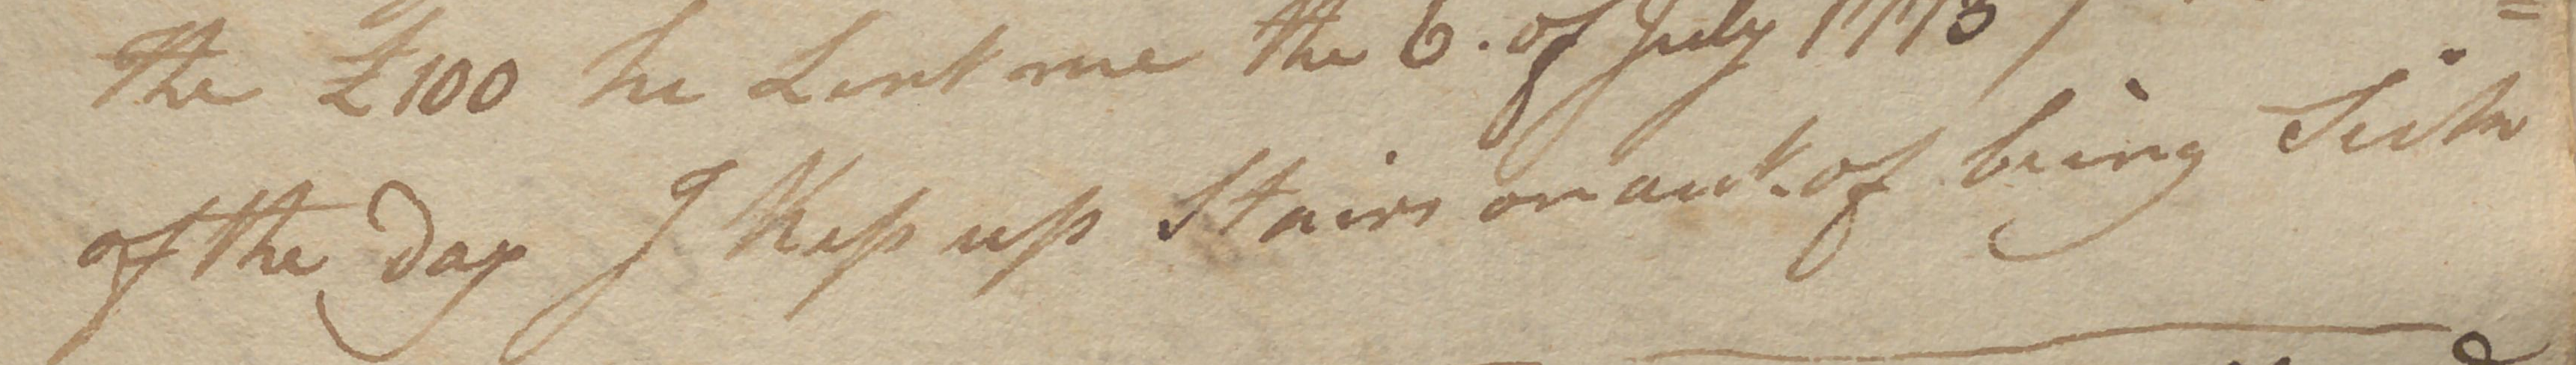of the day I Kep up Stairs on acc^t. of being Sick
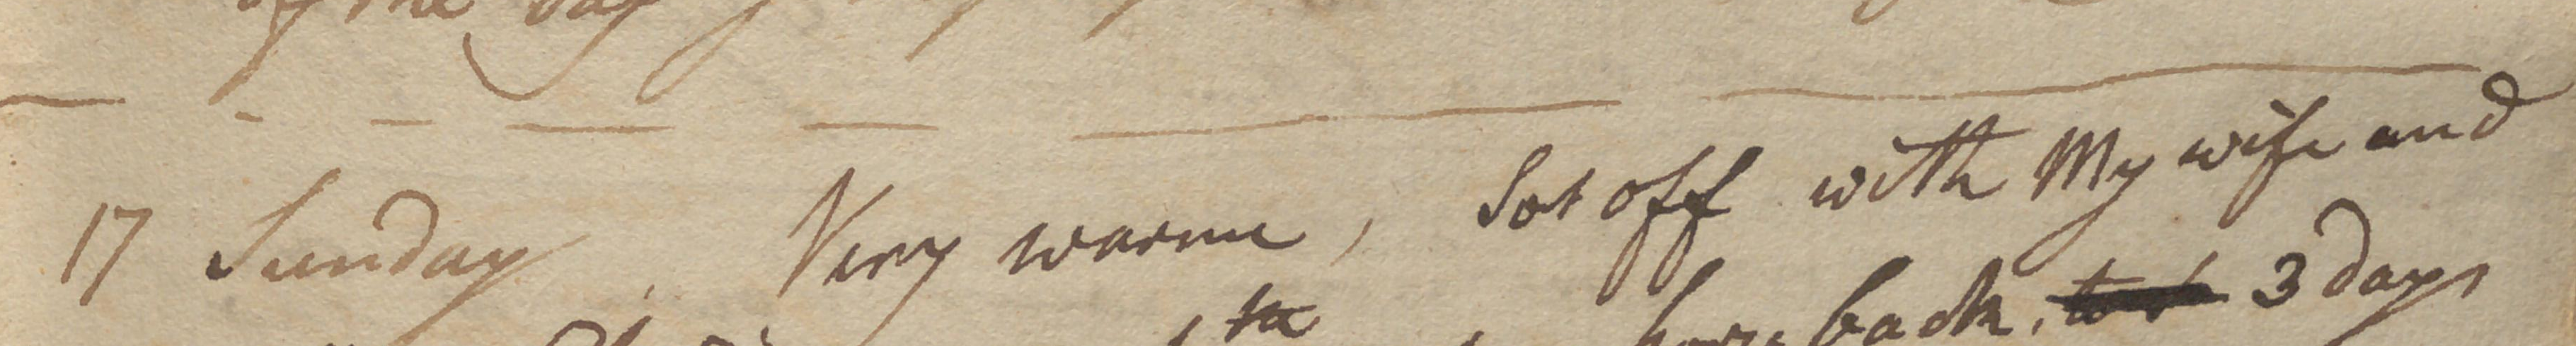17 Sunday Very warme, Sat off with My wife and
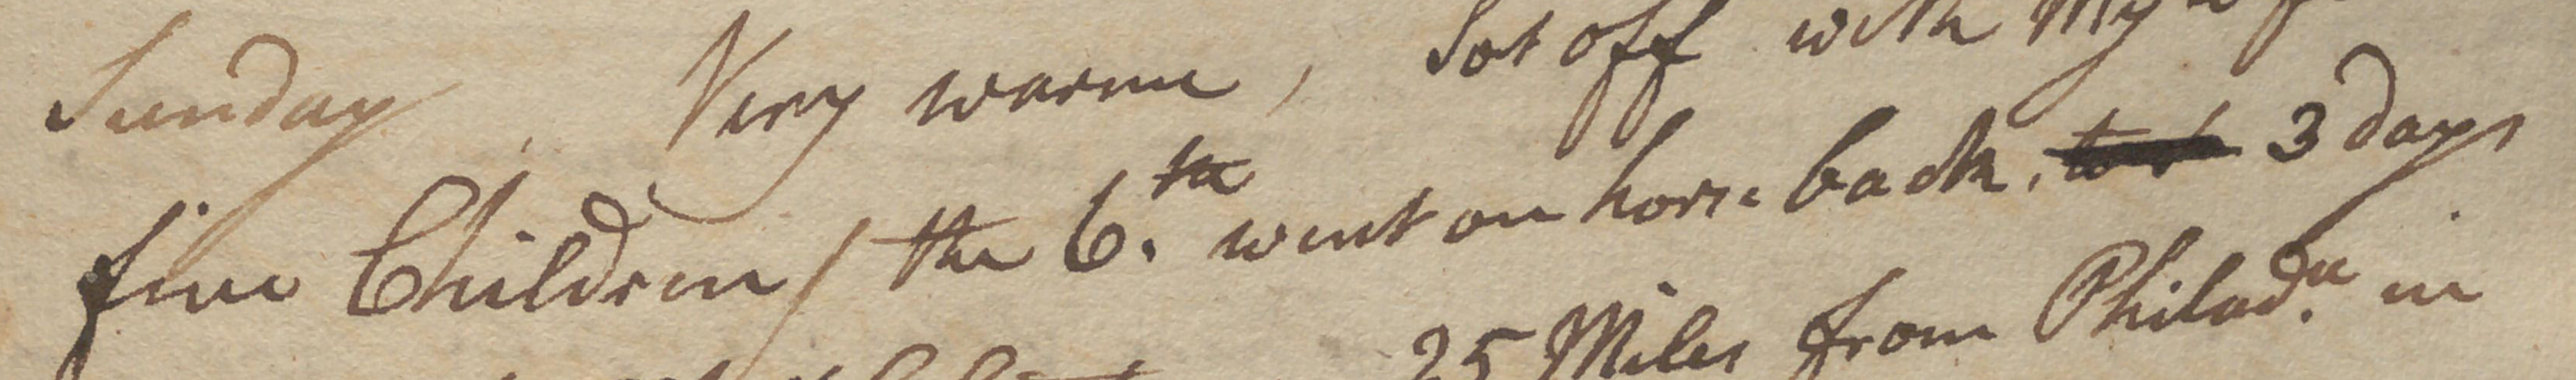five Children, the 6^th. went on horse back [to] 3 days
